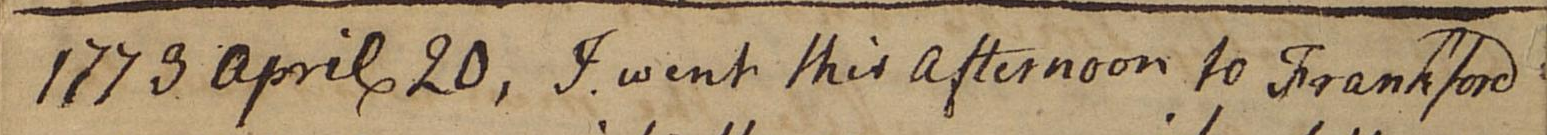1173 April 20, I went this Afternoon to Frankford
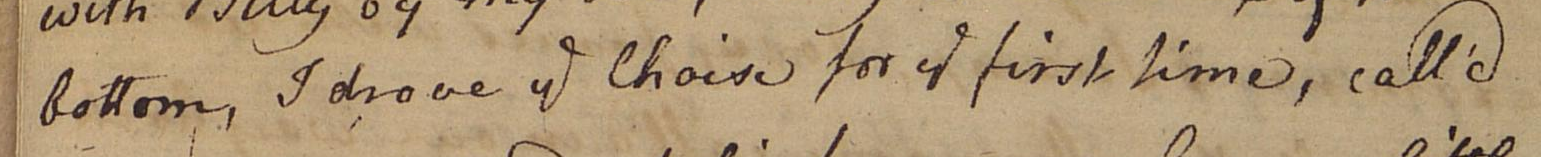bottom, I drove y^e Choise for y^e first time, call'd
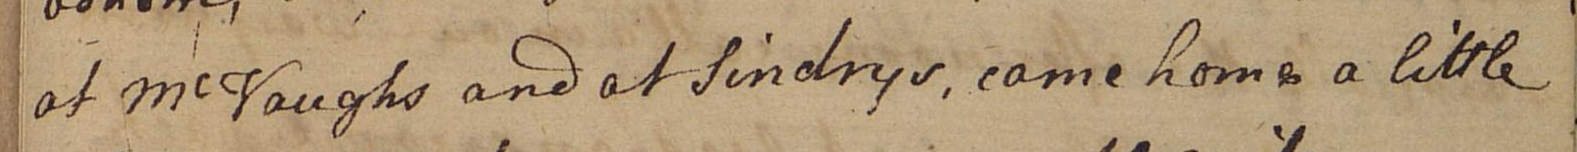at M^cVaughs and at Sindrys, came home a little
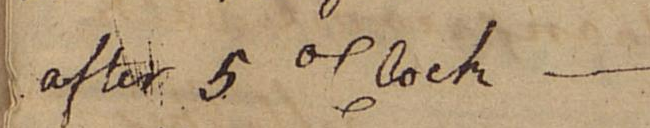after 5 oClock-
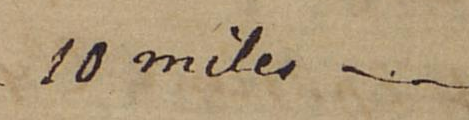10 miles-
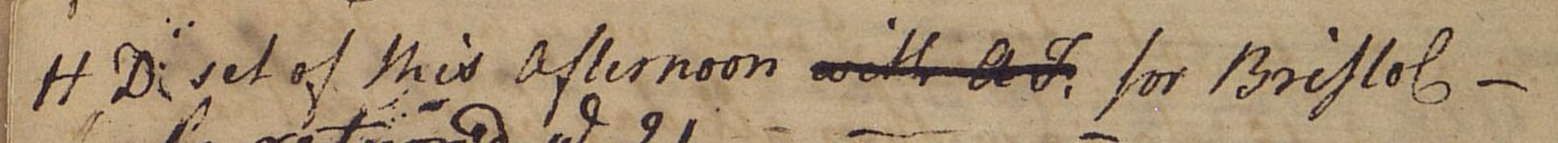HD. set of this afternoon [with AJ.] for Bristol-
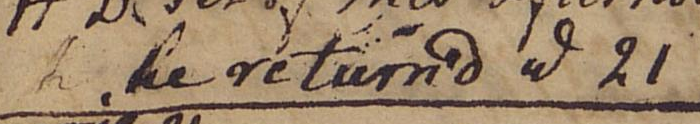,he return'd y^e 21
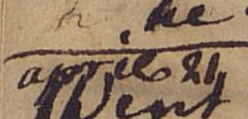april 21
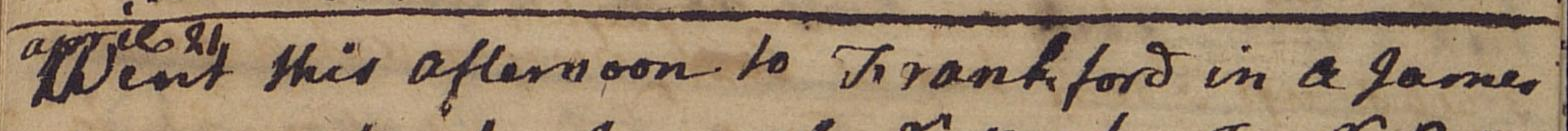Went this afternoon to Frankford in A James
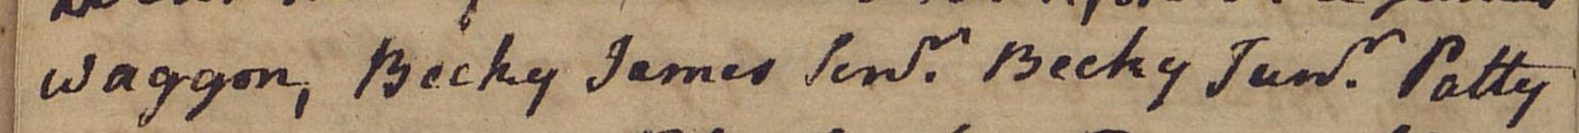waggon, Becky James Sen^r. Becky Jun^r. Patty
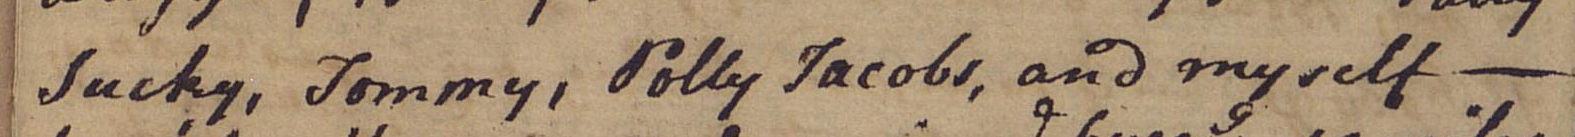Sucky, Tommy, Polly Jacobs, and myself-
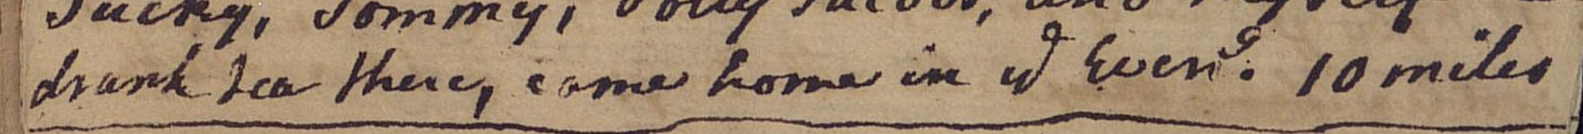drank tea there, came home in y^e Even^g. 10 miles
